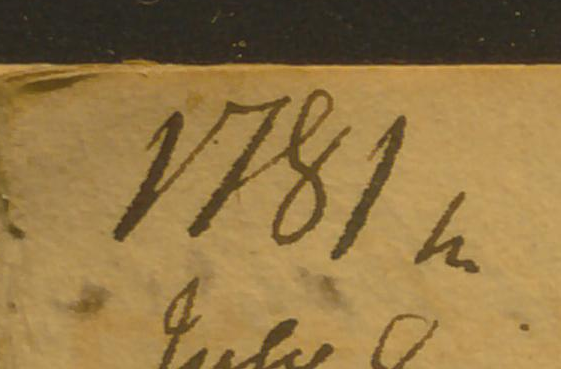1781
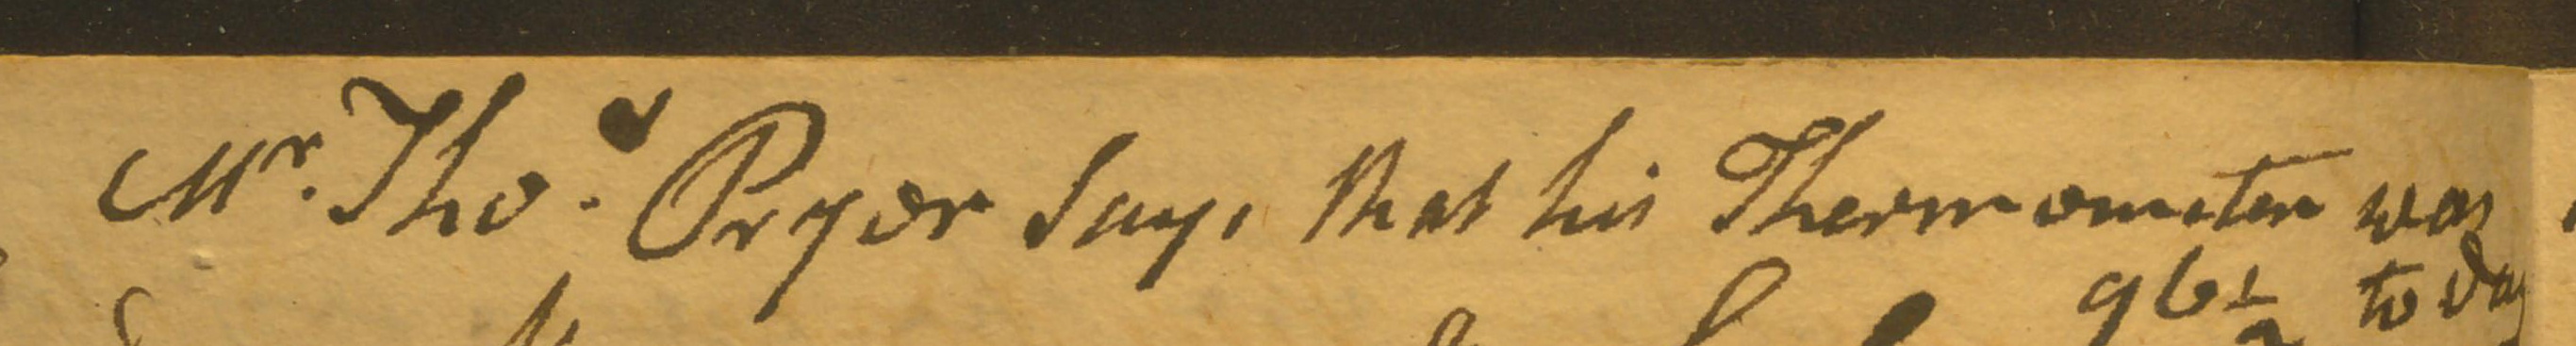M^r. Tho^s. Pryor Says that his Thermometer was
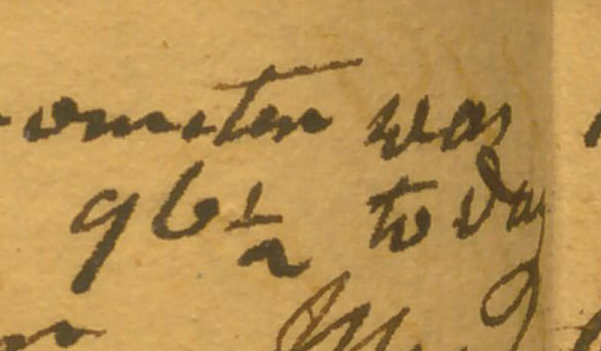96 1/2 today
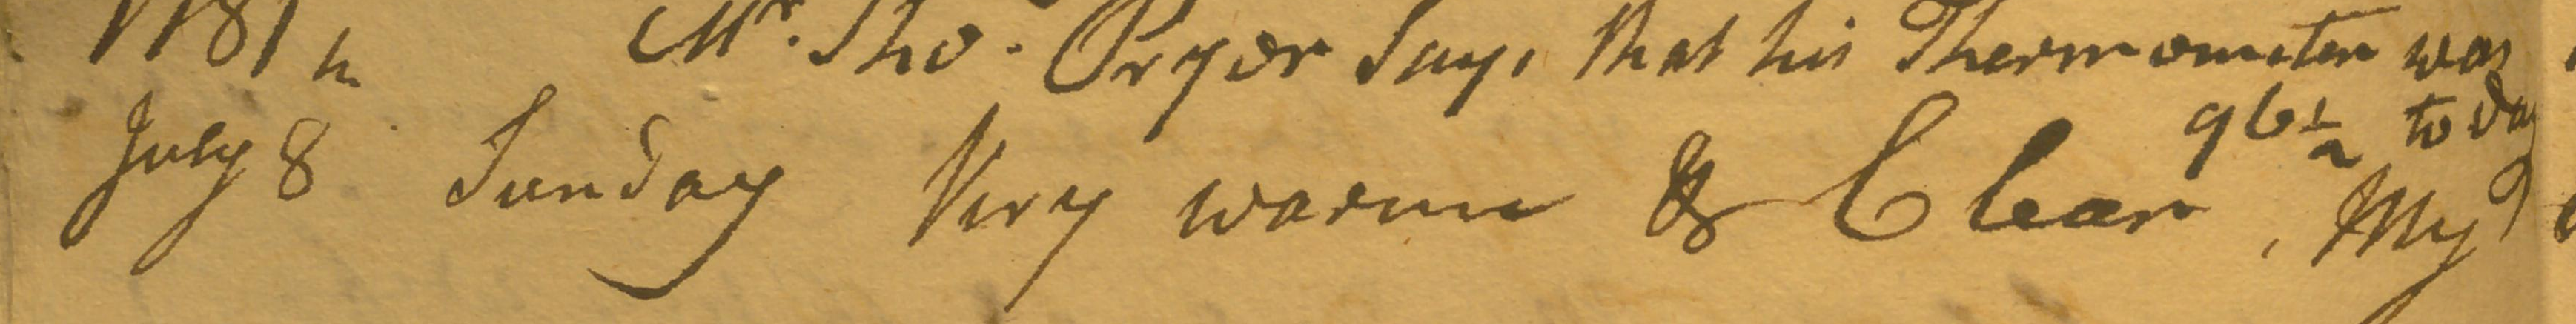July 8 Sunday Very warme & Clear, My
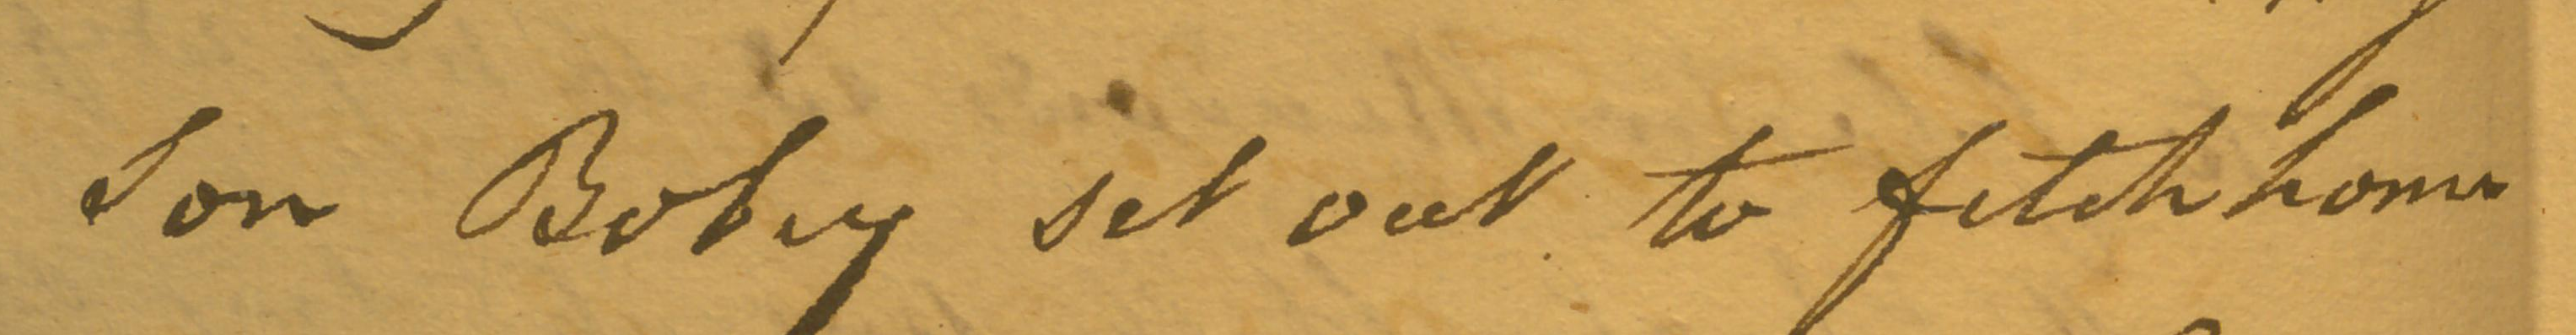Son Bobey set out to fetch home
